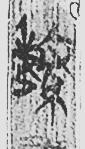繫
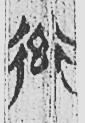率
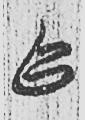𠂤
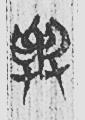與
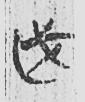戉
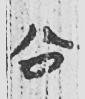公
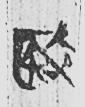殹
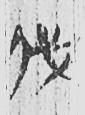伐
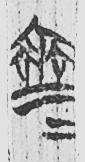齊=
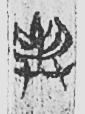與
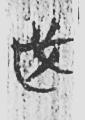戉
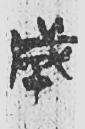成
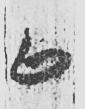㠯（以）
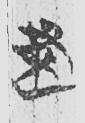建
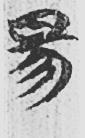昜
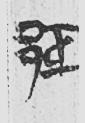{巨阝}
